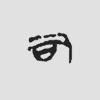司
